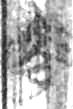夜
